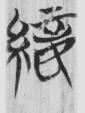{糸妾}
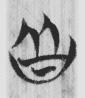皆
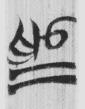爲
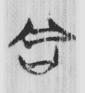同
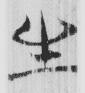生
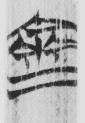齊
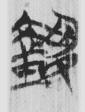執
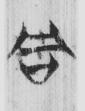同
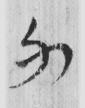力
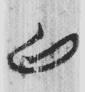㠯（以）
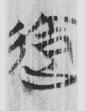御
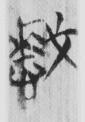{𠦪戈}
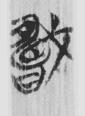{𠷎戈}
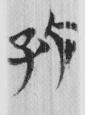孤
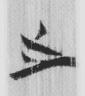之
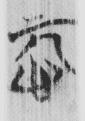{元心}
